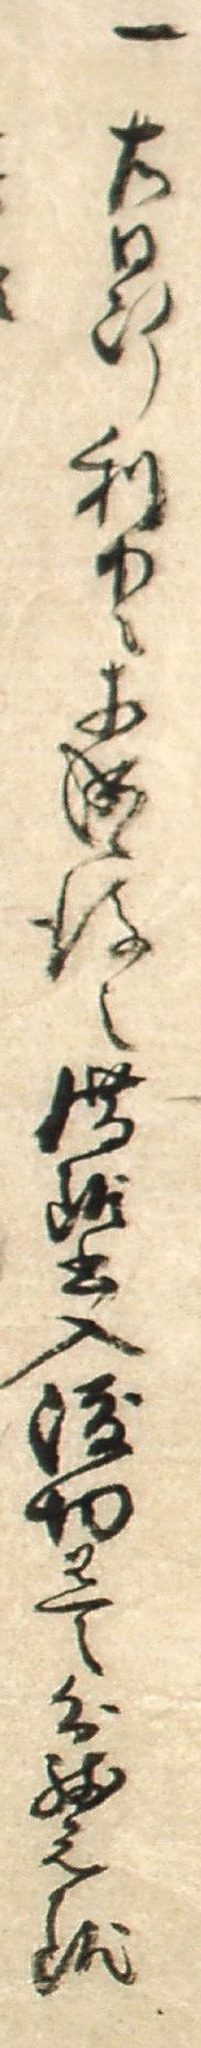一右同断利下に相成候後之借銀書入渡切有之分残元銀
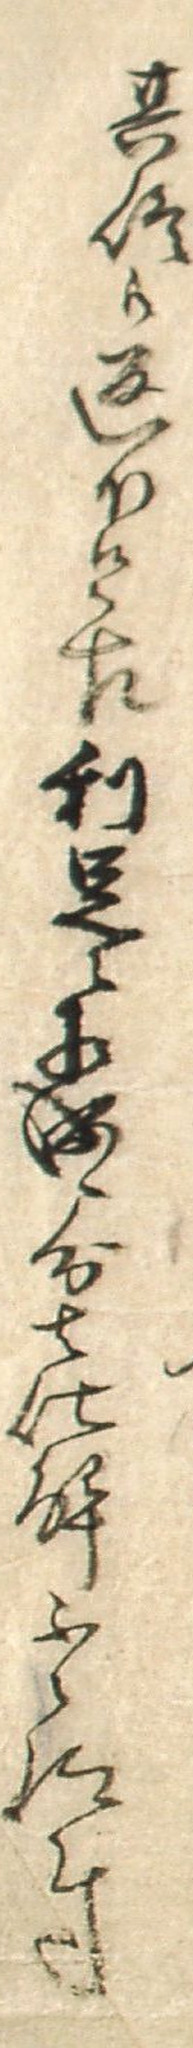其儘被返下候筈利足に相成候分は仕解不被仰付

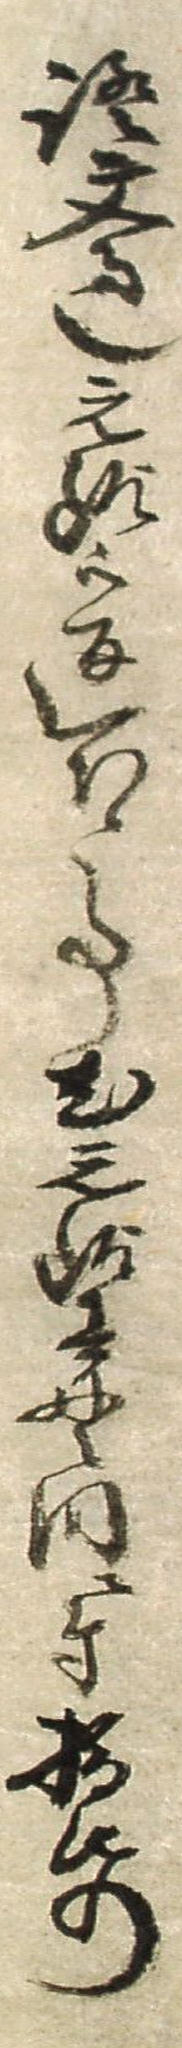証文通元銀被返下候事尤元銀壱貫目に付指紙
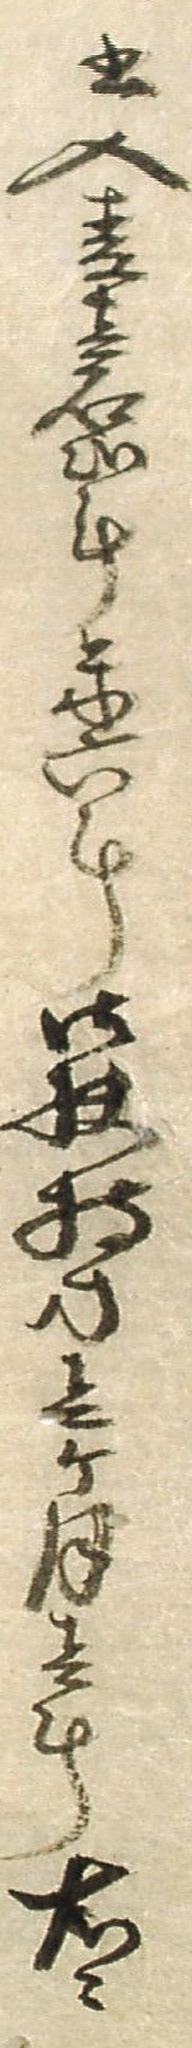書入麦壱石弐斗米六斗御扶持方壱ヶ月壱斗右に
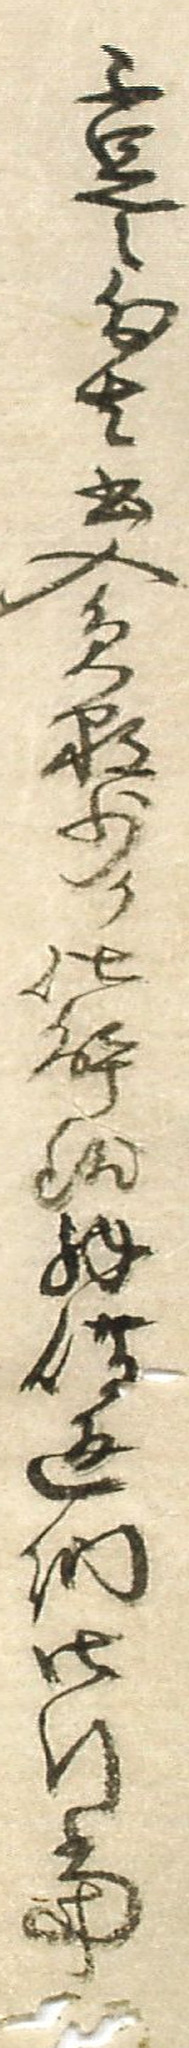不足之分は書入員数少く仕解銀拝借返納御引当
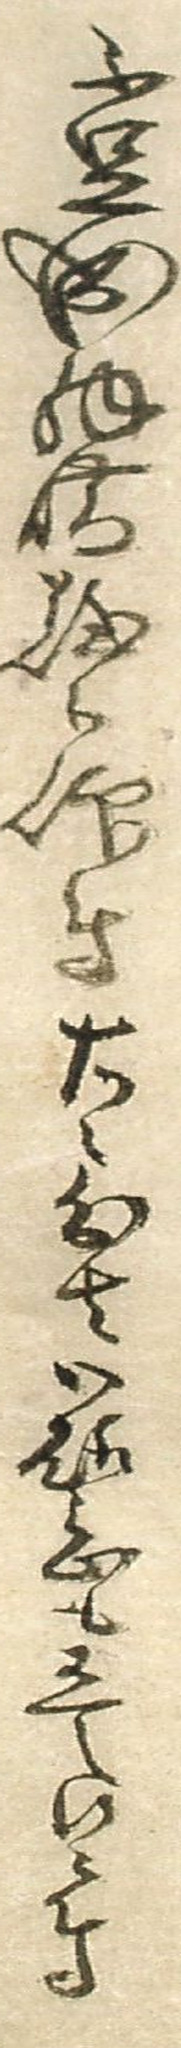不足成拝借難被仰付右之分は御趣意も有之候に付
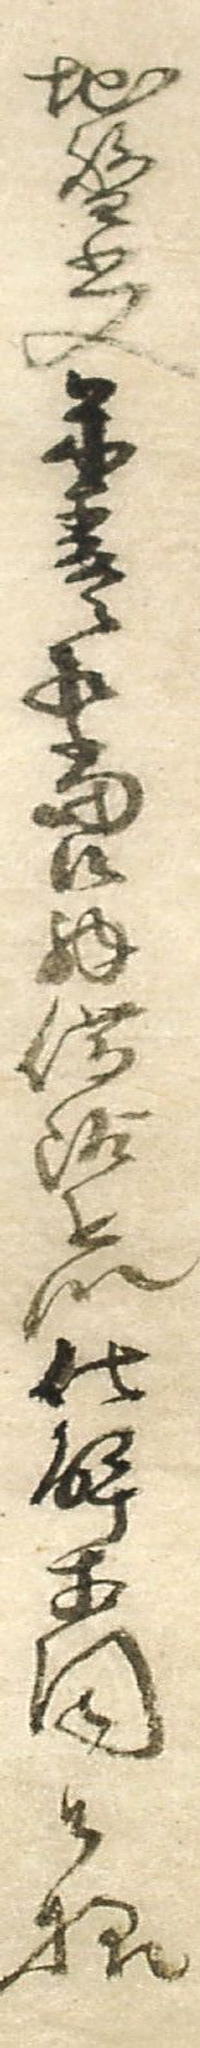地盤書入米麦に相当候拝借銀を以仕解相伺候様
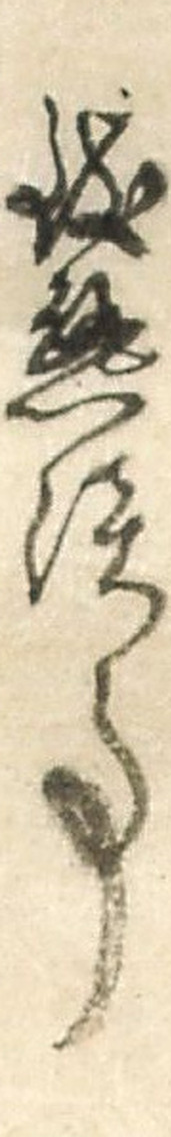致熟談事
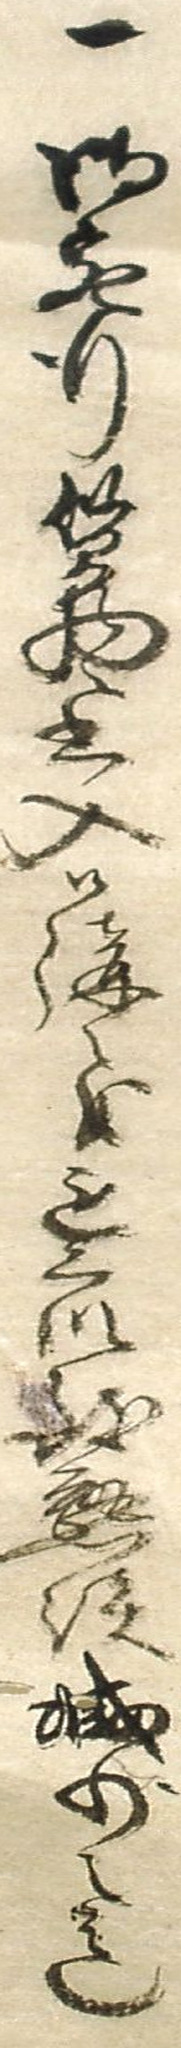一御宛行質物に書入候溝之義連衆致熟談減少之道
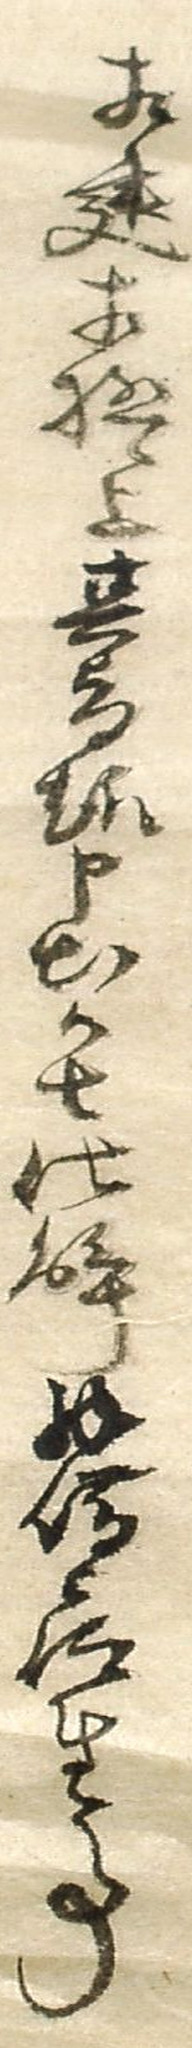相建相極候上其旨趣申出候は仕解拝借被仰付候事
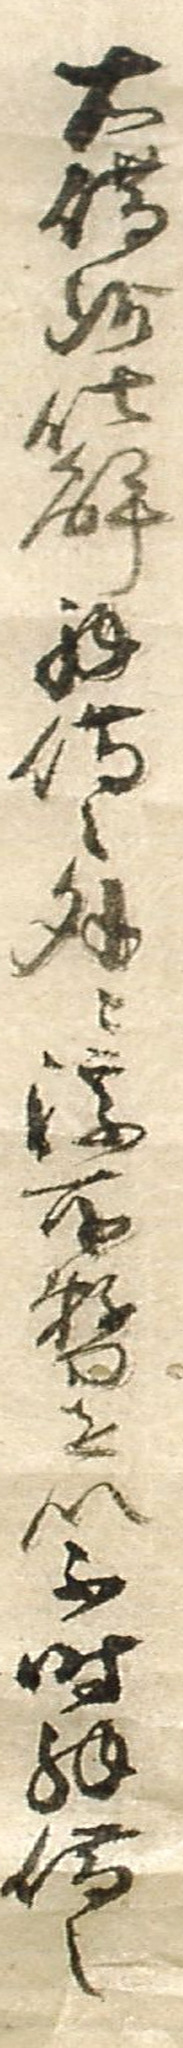右借銀仕解拝借之外に浮所務を以不時拝借之
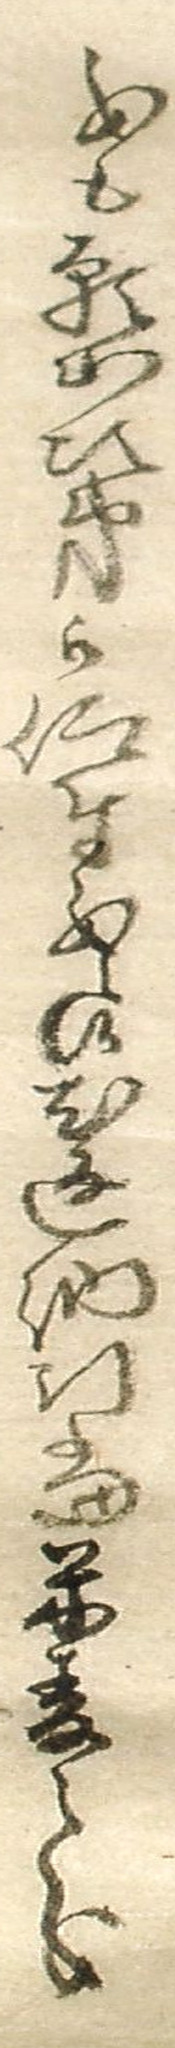義も願出次第被仰付候義に候尤返納引当米麦之義
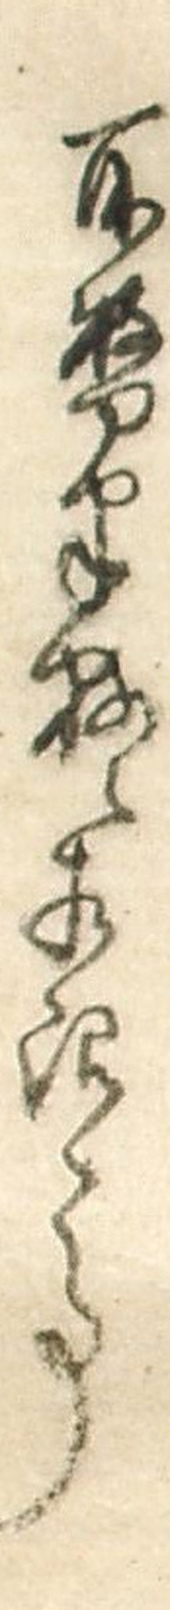所務半数に相限候事
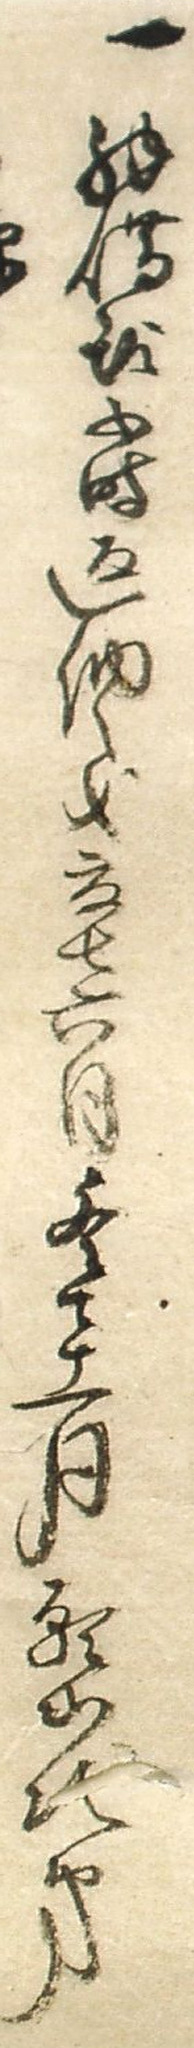一拝借銀不時返納之義夏は六月冬は十一月願出次第
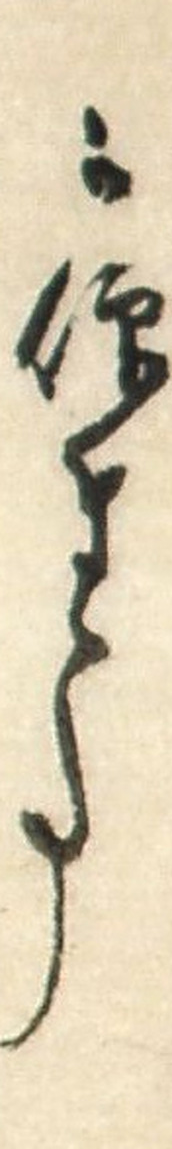被仰付候事
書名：御家中并無格御奉公人借銀御仕解一件御書付写其余共控
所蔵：鳴門教育大学 Naruto University of Education
